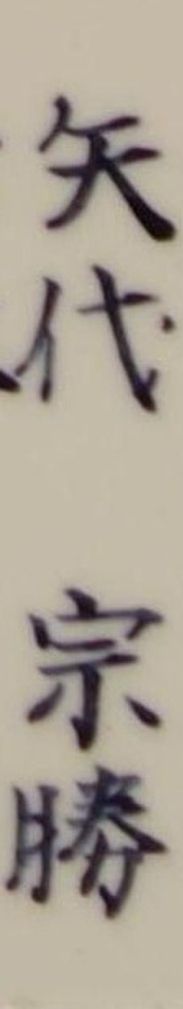矢代宗勝
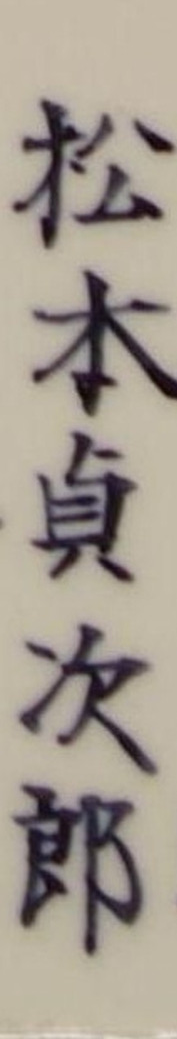松本貞次郎
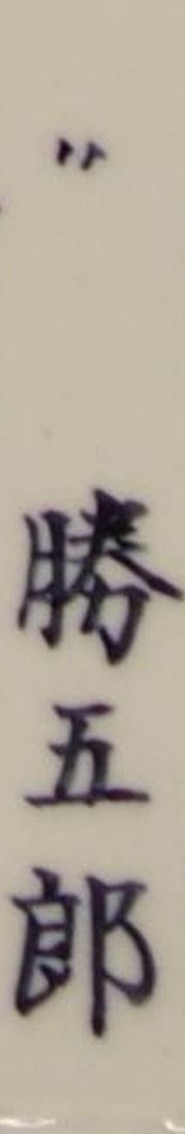勝五郎
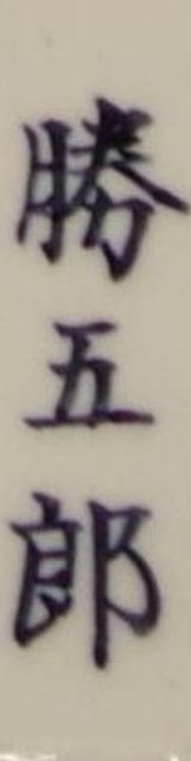勝五郎
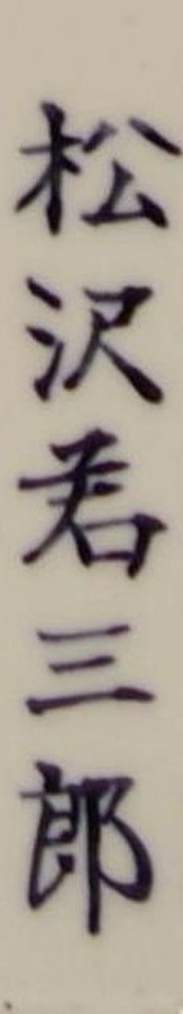松沢君三郎
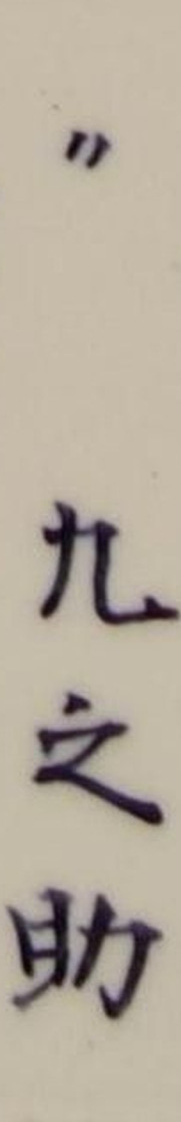九之助
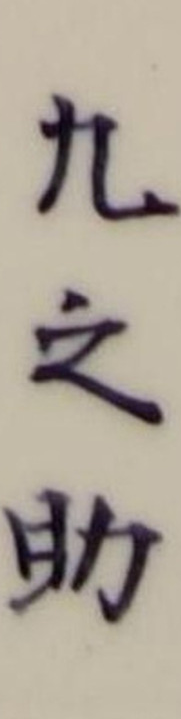九之助
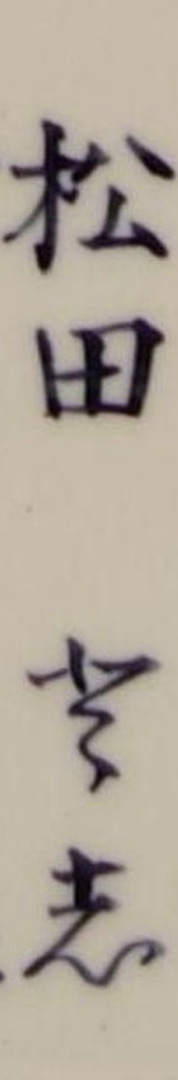松田とし
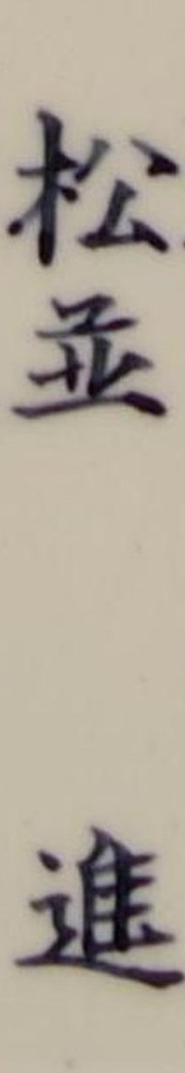松並進
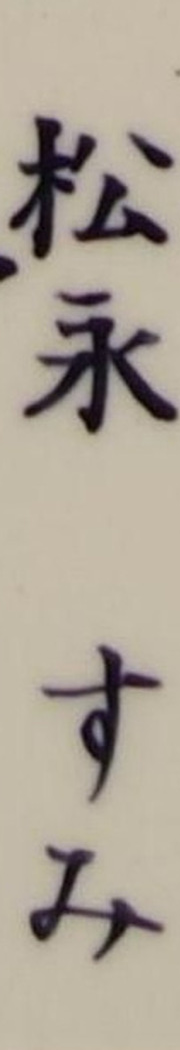松永すみ
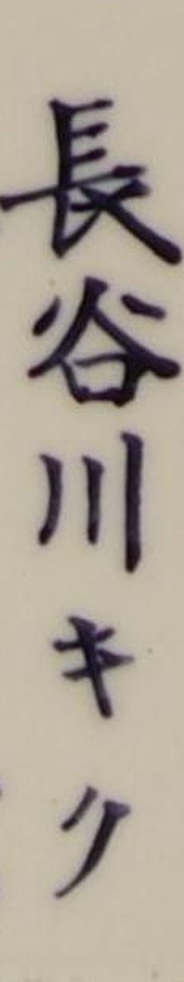長谷川キク
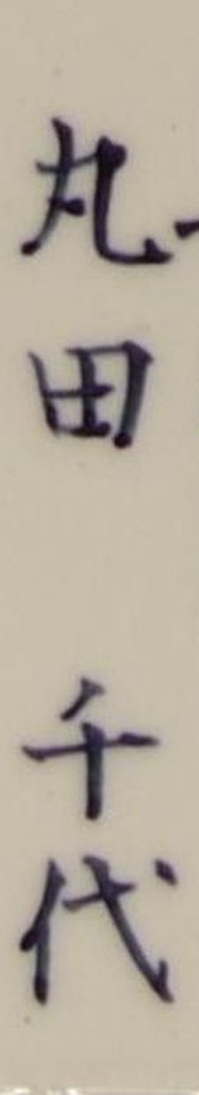凡田千代
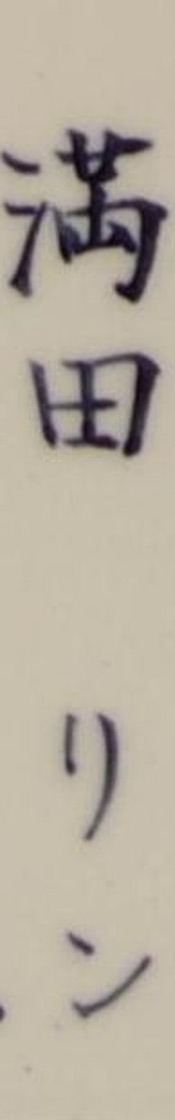満田リン
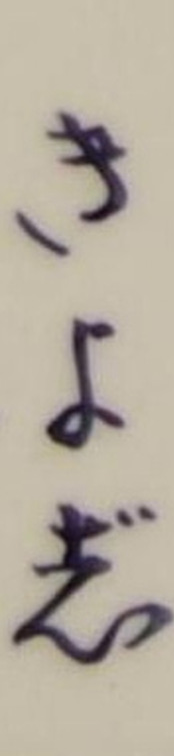きよじ

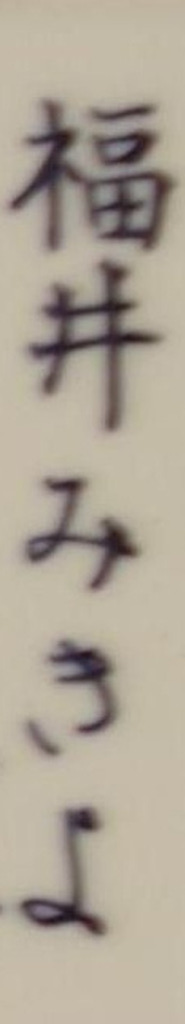福井みきよ
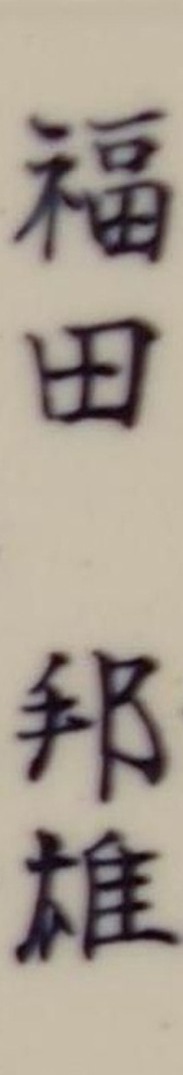福田邦雄
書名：M~S
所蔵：高野山金剛峯寺
